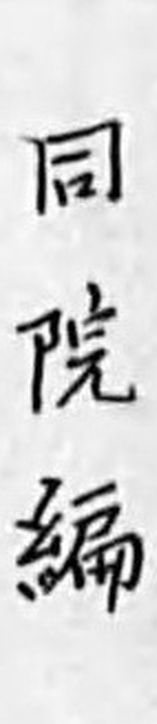同院編
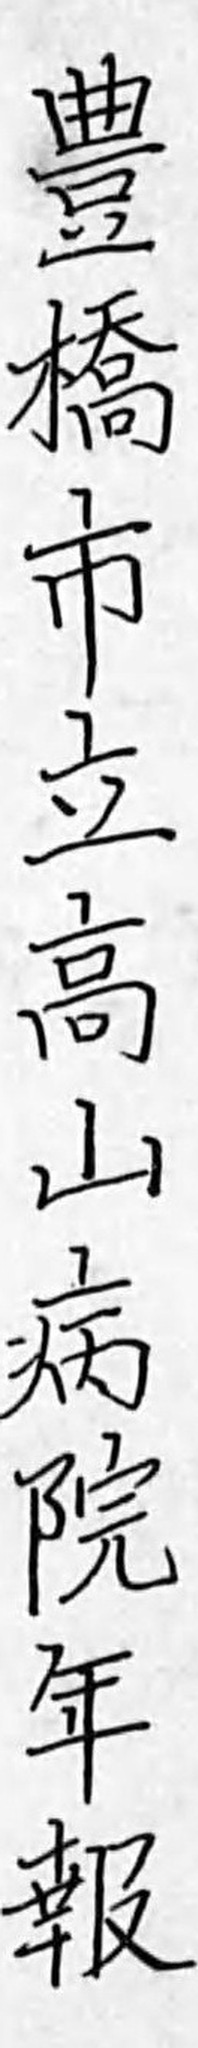豊橋市立高山病院年報
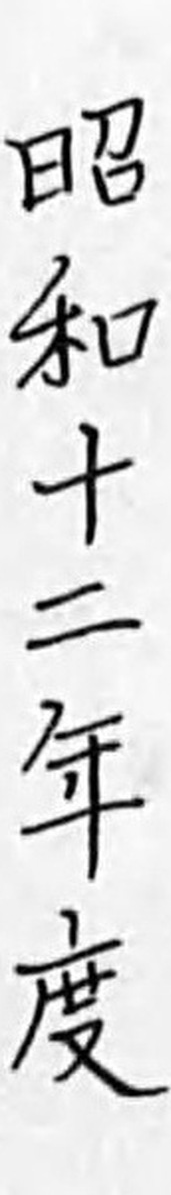昭和十二年度

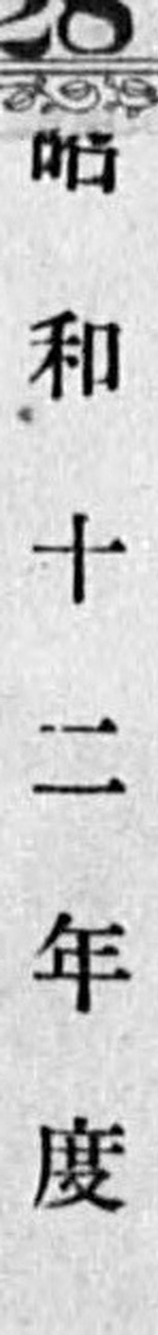昭和十二年度
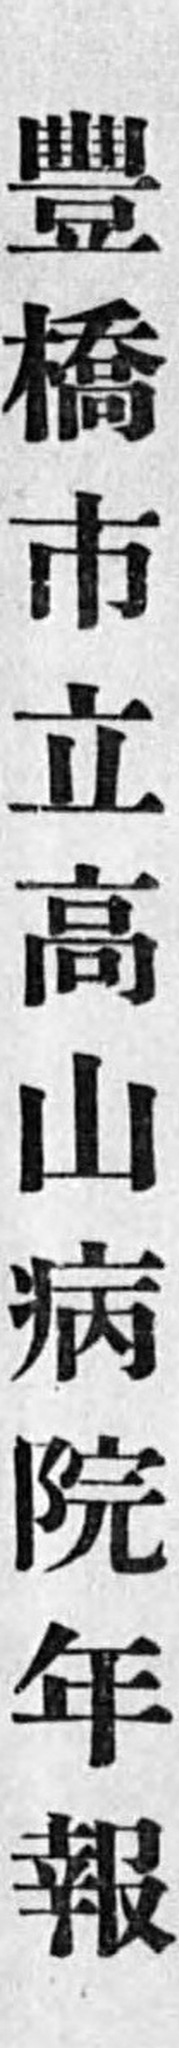豊橋市立高山病院年報

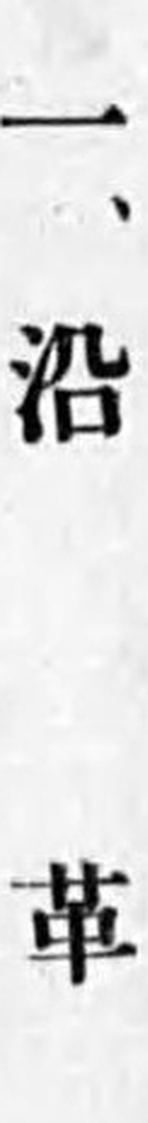一．沿革
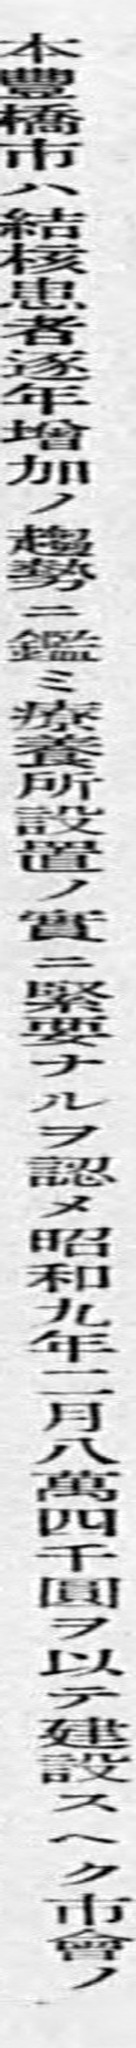本豊橋市ハ結核患者逐年増加ノ趨勢ニ鑑ミ療養所設置ノ實ニ緊要ナルヲ認メ昭和九年二月八萬四千圓ヲ以テ建設スヘク市會ノ
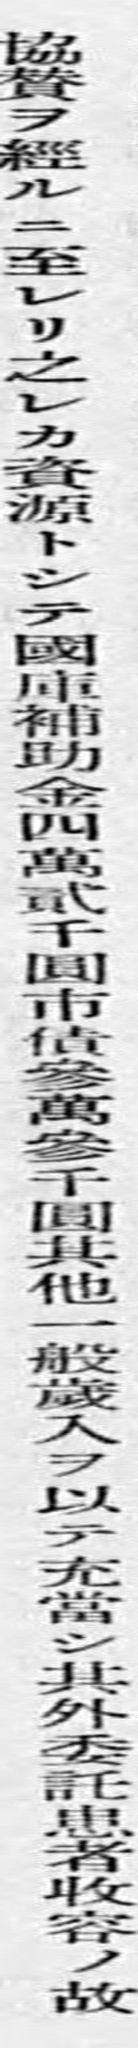協賛ヲ經ルニ至レリ之レカ資源トシテ國庫補助金四萬弐千圓市債参萬参千圓其他一般歳入ヲ以テ充當シ其外委託患者収容ノ故
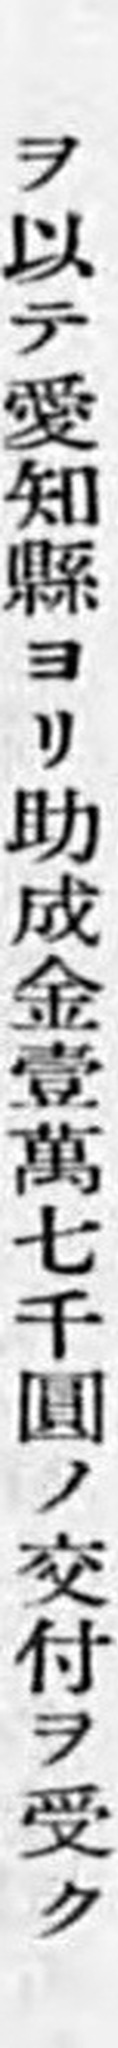ヲ以テ愛知縣ヨリ助成金壹萬七千圓ノ交付ヲ受ク
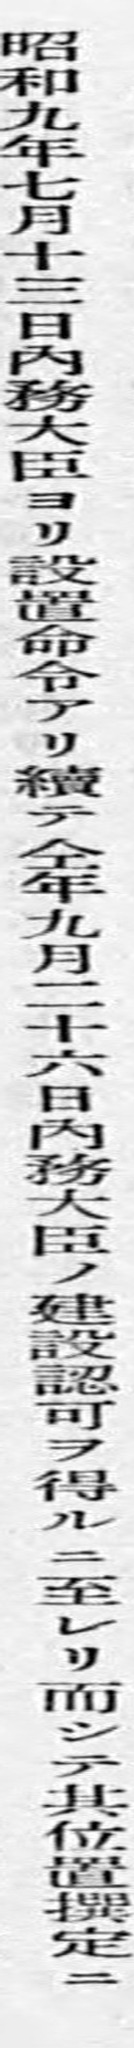昭和九年七月十三日内務大臣ヨリ設置命令アリ續テ仝年九月二十六日内務大臣ノ建設認可ヲ得ルニ至レリ而シテ其位置撰定ニ
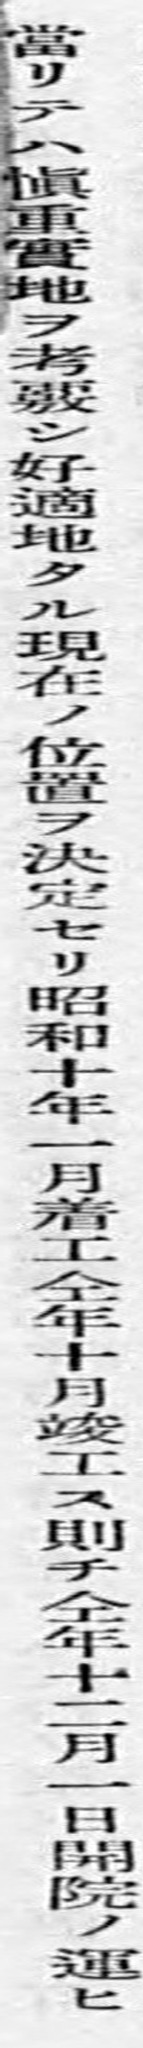當リテハ慎重實地ヲ考覈シ好適地タル現在ノ位置ヲ決定セリ昭和十年一月着工仝年十月竣工ス則チ仝年十二月一日開院ノ運ヒ
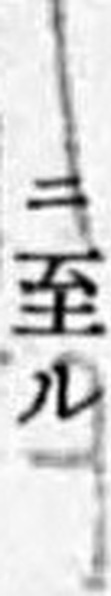ニ至ル
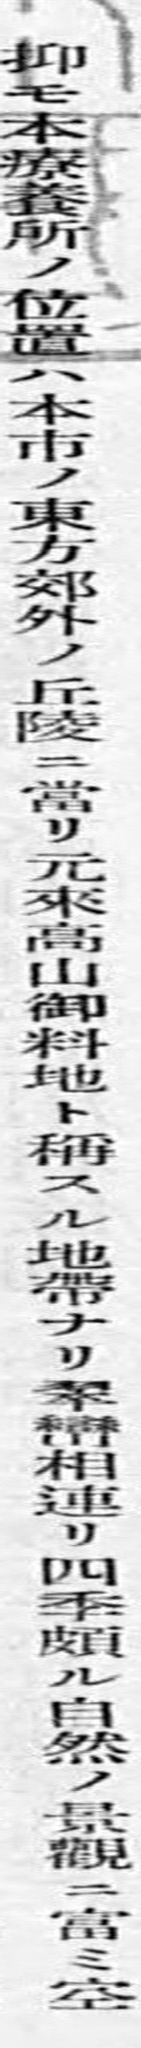抑モ本療養所ノ位置ハ本市ノ東方郊外ノ丘陵ニ當リ元来高山御料地ト稱スル地帯ナリ翠巒相連リ四季頗ル自然ノ景観ニ富ミ空
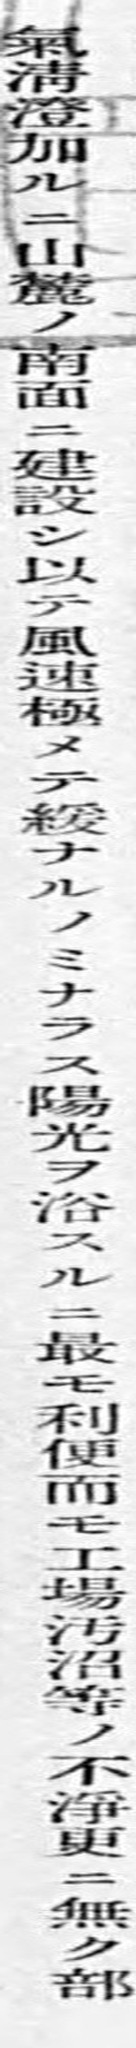氣清澄加ルニ山麓ノ南面ニ建設シ以テ風速極メテ緩ナルノミナラス陽光ヲ浴スルニ最モ利便而モ工場汚沼等ノ不淨更ニ無ク部
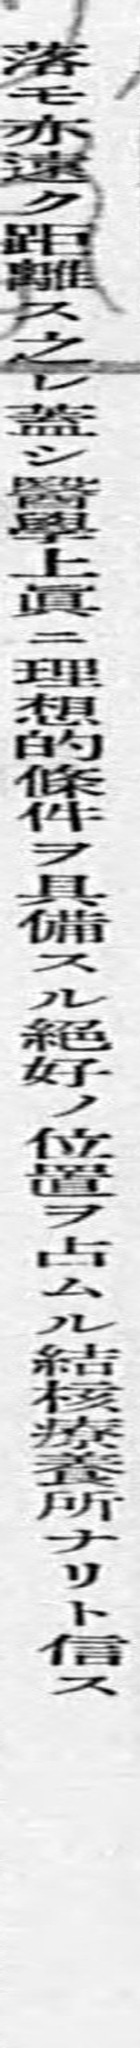落モ亦遠ク距離ス之レ蓋シ醫學上眞ニ理想的條件ヲ具備スル絶好ノ位置ヲ占ムル結核療養所ナリト信ス
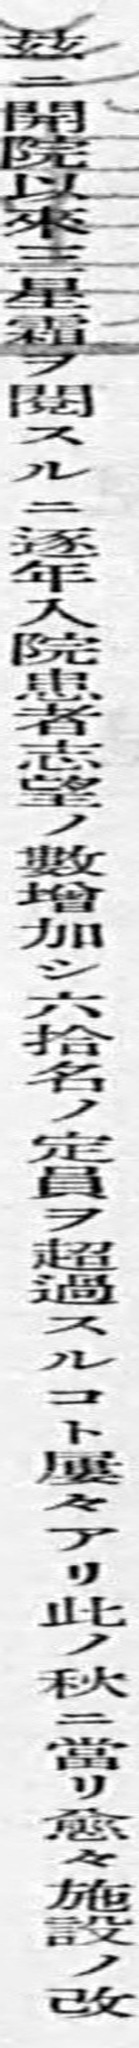茲ニ開院以来三星霜ヲ閲スルニ逐年入院患者志望ノ數増加シ六拾名ノ定員ヲ超過スルコト屡々アリ此ノ秋ニ當リ愈々施設ノ改
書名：豊橋市立高山病院年報. 昭和12年度
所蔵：国立国会図書館 National Diet Library, JAPAN
